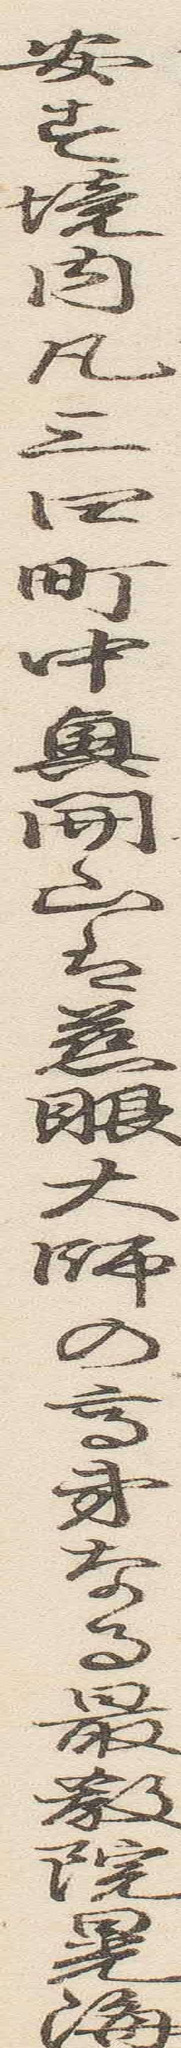安す境内凡三四町中興開山は慈眼大師の高㐧なる最敎院晃海
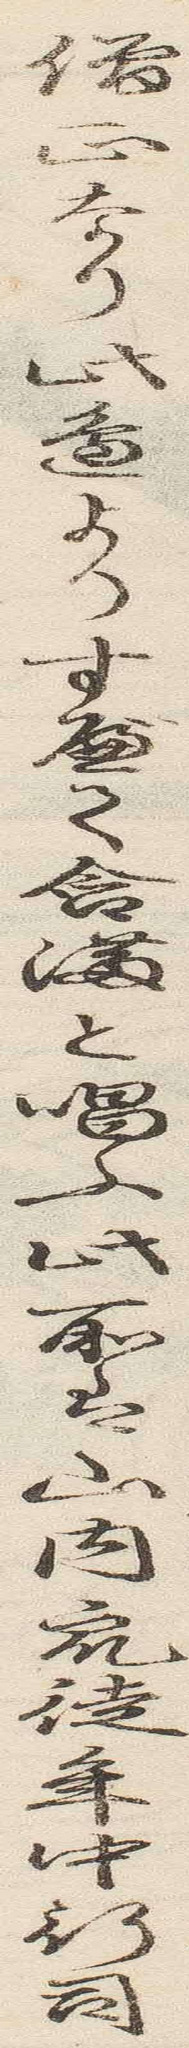僧正なり此邊よりすべて含満と唱ふ此所は山内衆徒年中行司
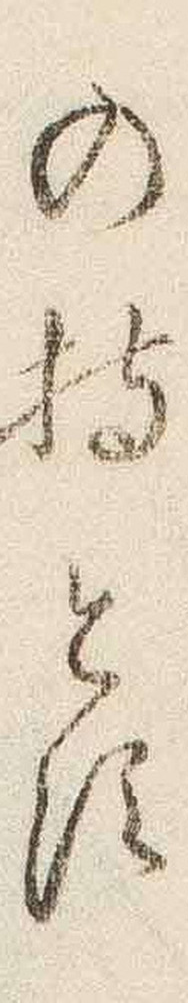の持とす
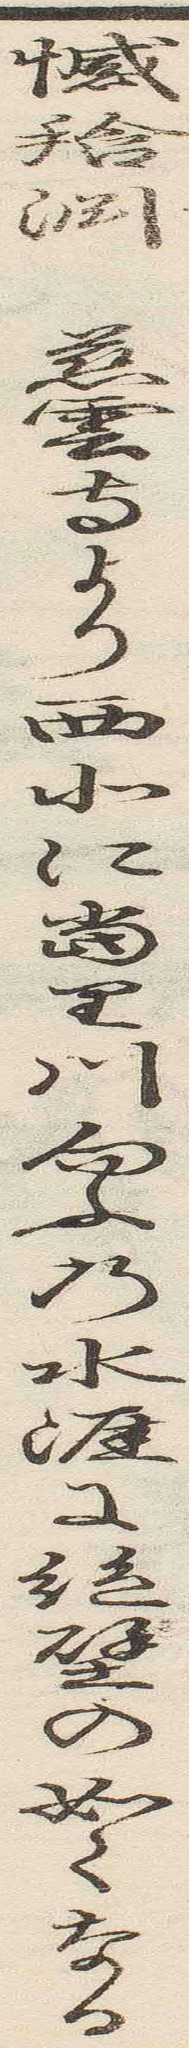憾𤚥淵慈雲寺より西北に當り川向ふの水涯に絶壁の如くなる
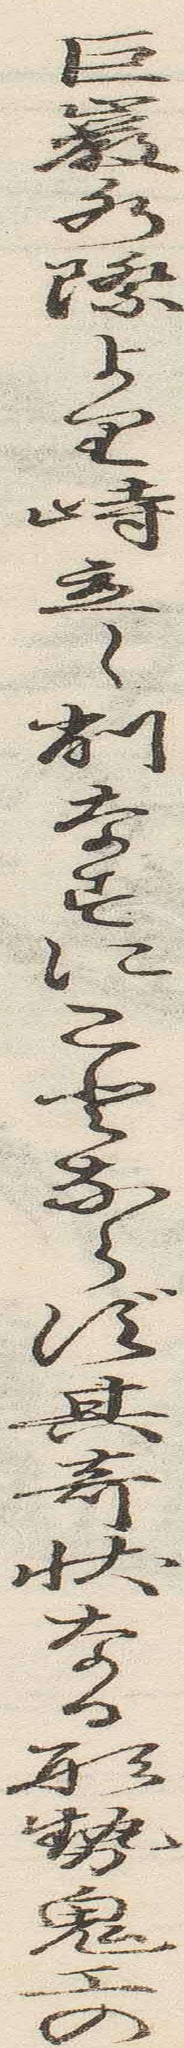巨巌水際より峙立し削なすにことならず其奇状なる形㔟鬼工の
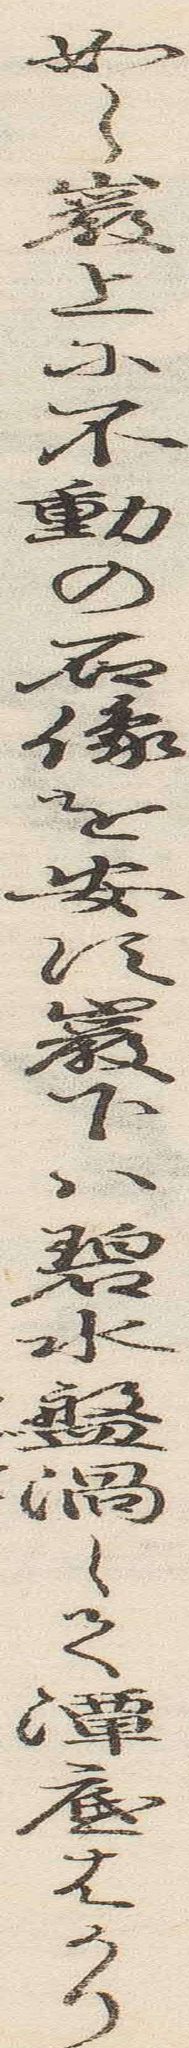如し巌上に不動の石像を安す巌下は碧水盤渦して潭底はかり
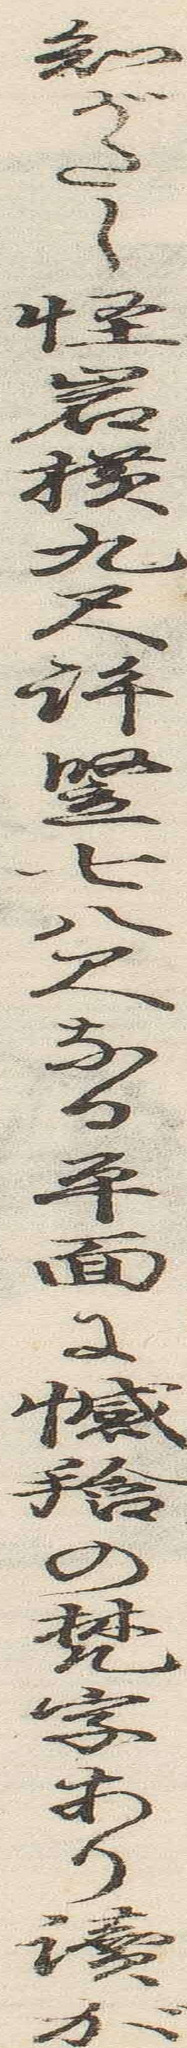知がたし怪岩横九尺許竪七八尺なる平面に憾𤚥の梵字あり讀が
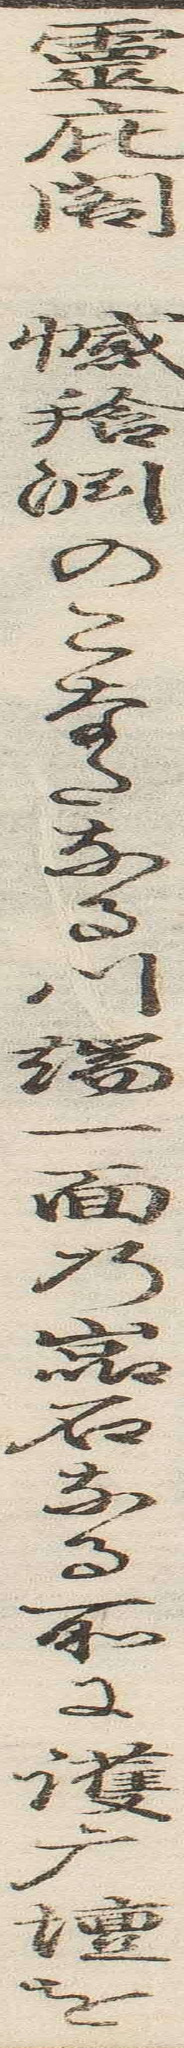靈庇閣憾𤚥淵のこなたなる川端一面の嵓石なる所に護广壇を
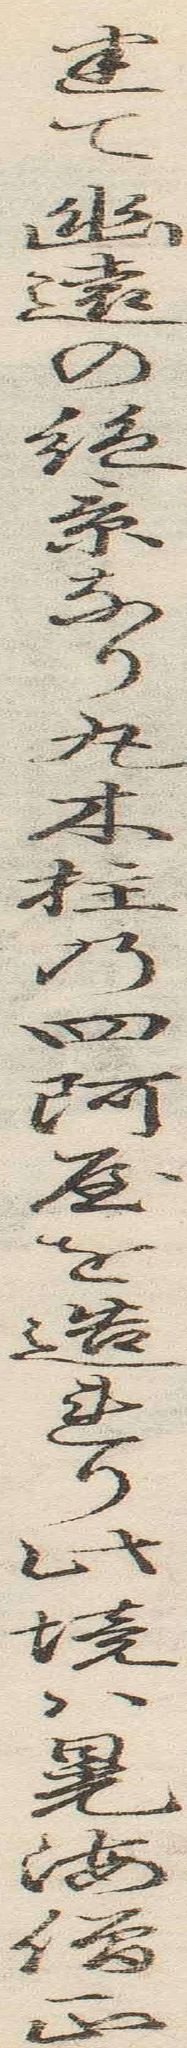建て幽遠の絶景なり丸木柱の四阿屋を造れり此境は晃海僧正
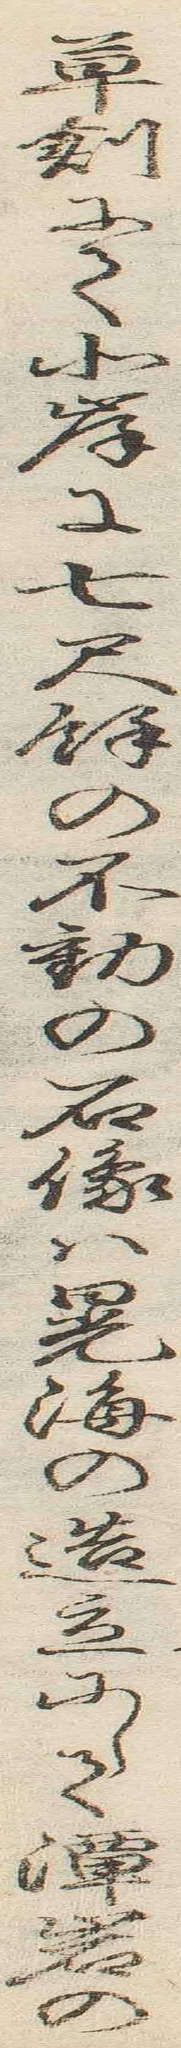草創にて北岸に七尺餘の不動の石像は晃海の造立にて潭岩の
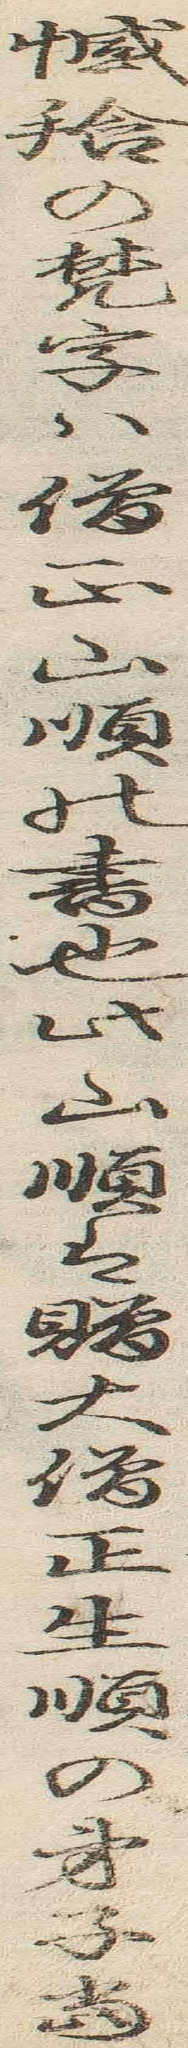憾𤚥の梵字は僧正山順の書也此山順は贈大僧正生順の㐧子當
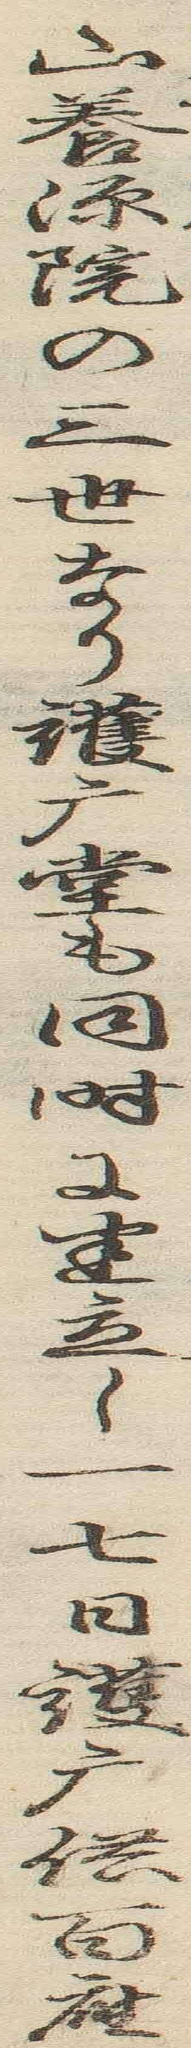山養源院の三世なり護广堂も同时に建立し一七日護广供百座

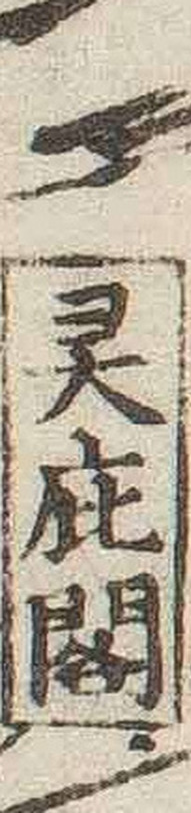㚑庇閣

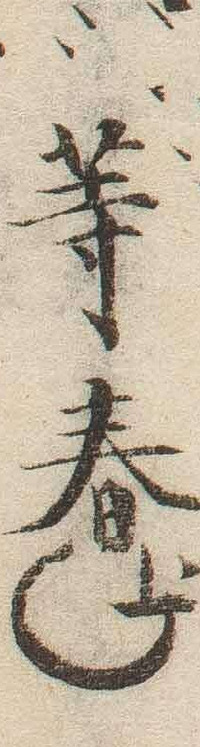等春印

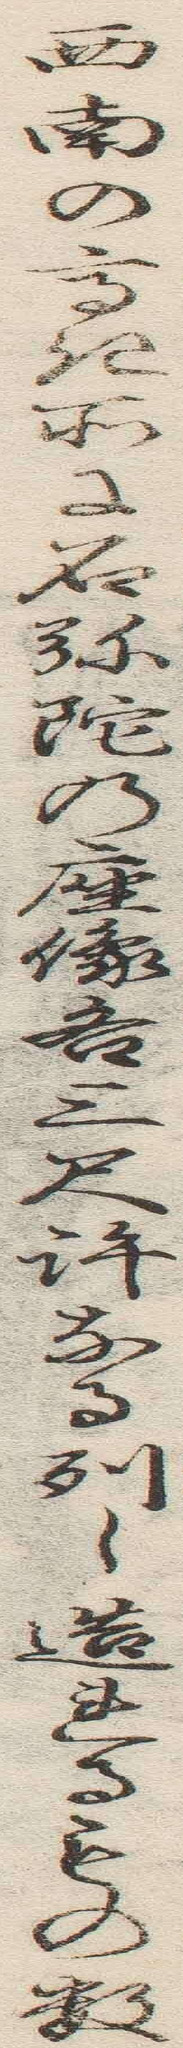西南の高き所に石弥陀の座像各三尺許なる列し造れるもの数
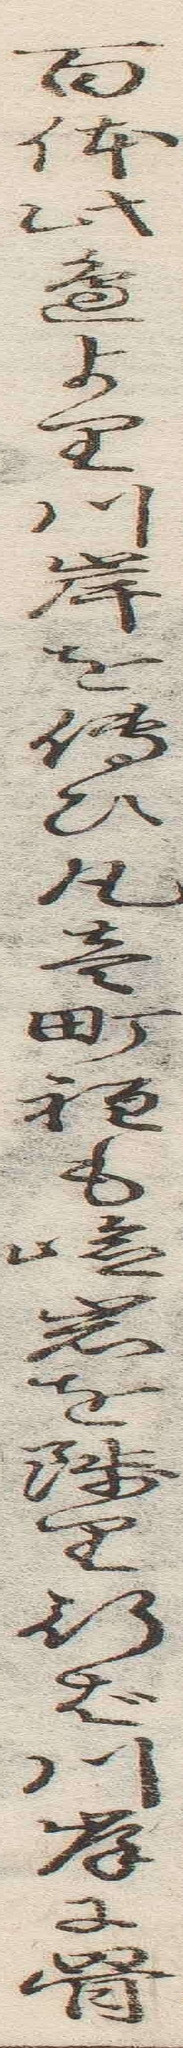百体此邊より川岸を傳ひ凡壱町程も嶮岩を陟り行ば川岸に骨
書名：日光山志
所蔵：東京学芸大学附属図書館 国文学研究資料館
